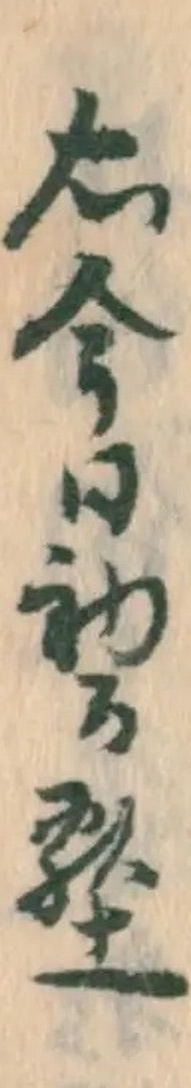右今日初而献上
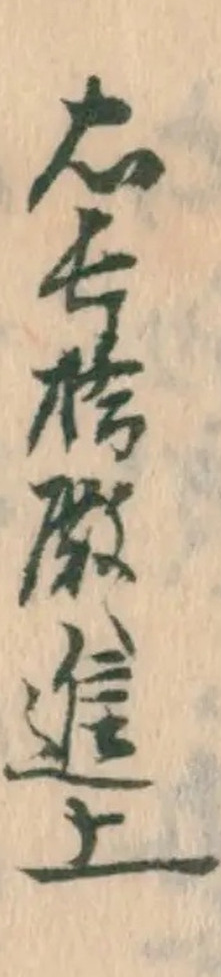右長橋殿進上
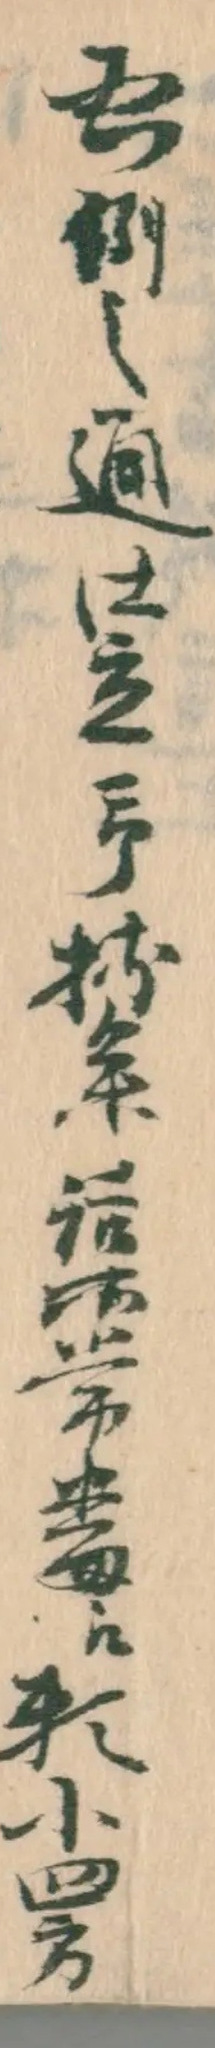右例之通仕立予持参詰所常番え頼小四方
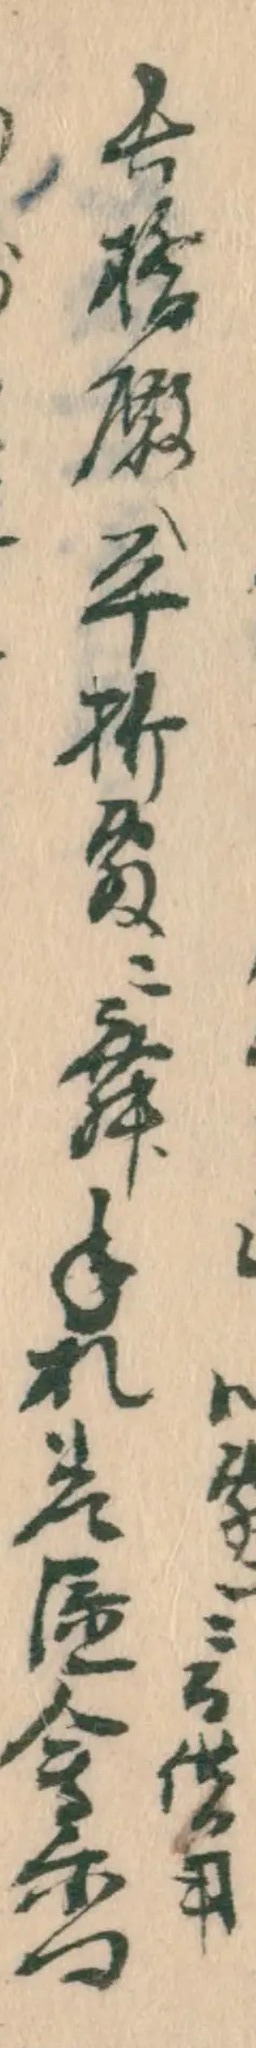長橋殿へ平折敷ニ舞手札差置会所向
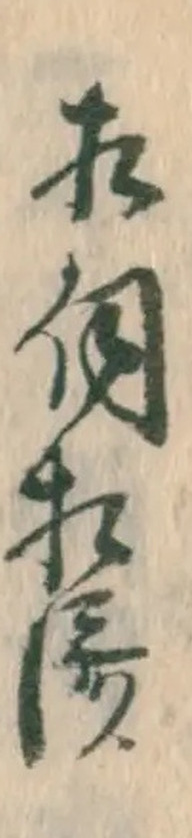相伺相済
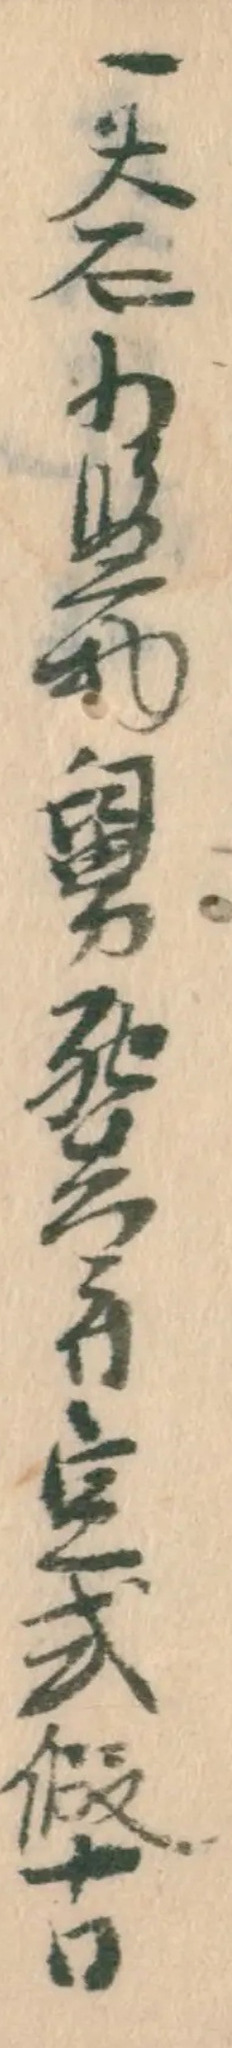一大石少監物舅死去ニ付定式仮十日
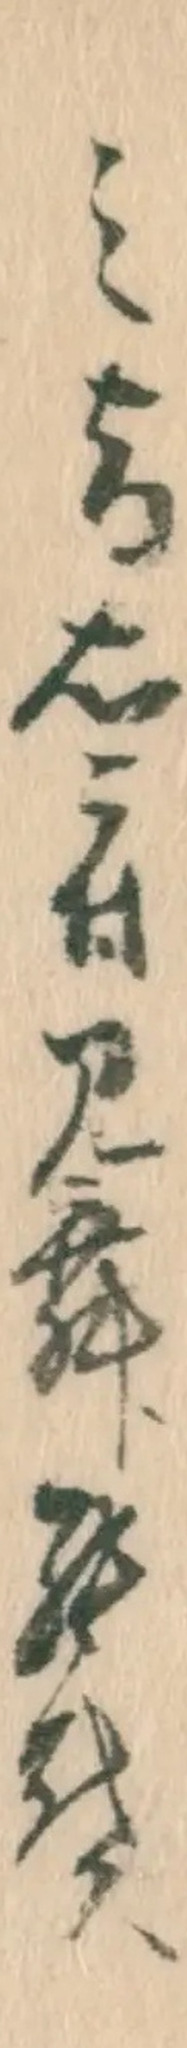之旨右ニ付見舞罷越ス
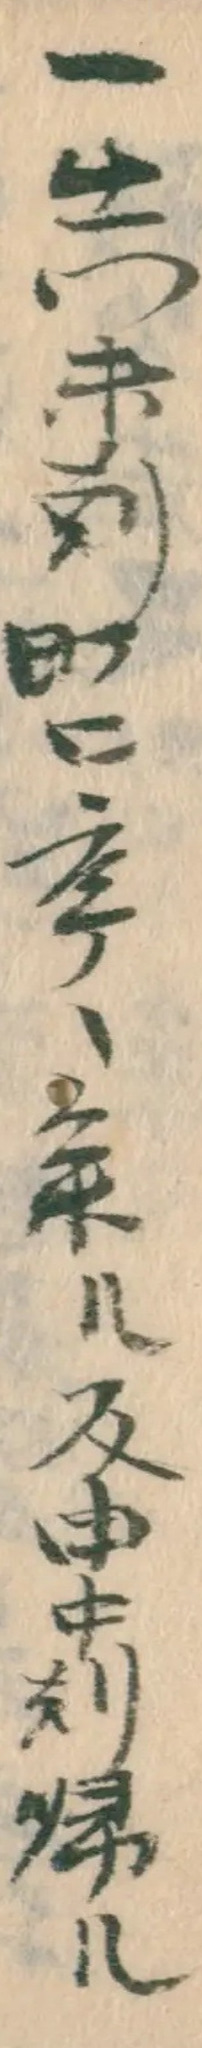一出門未刻町口亭へ参ル及申中刻帰ル
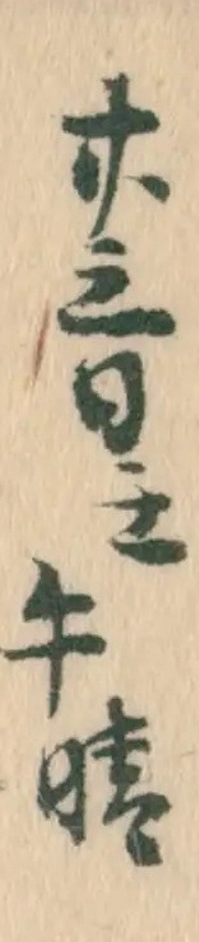廿三日壬午晴

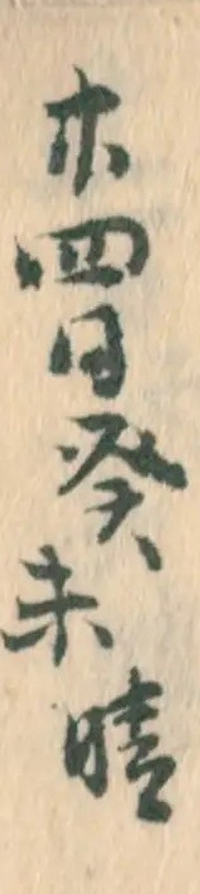廿四日癸未晴
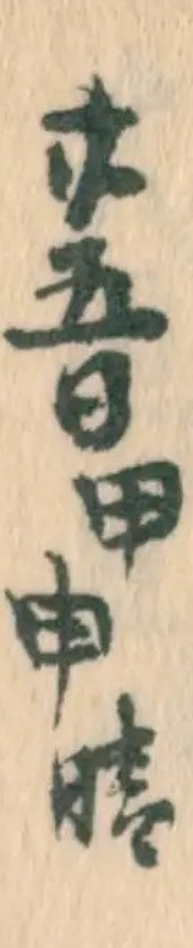廿五日甲申晴
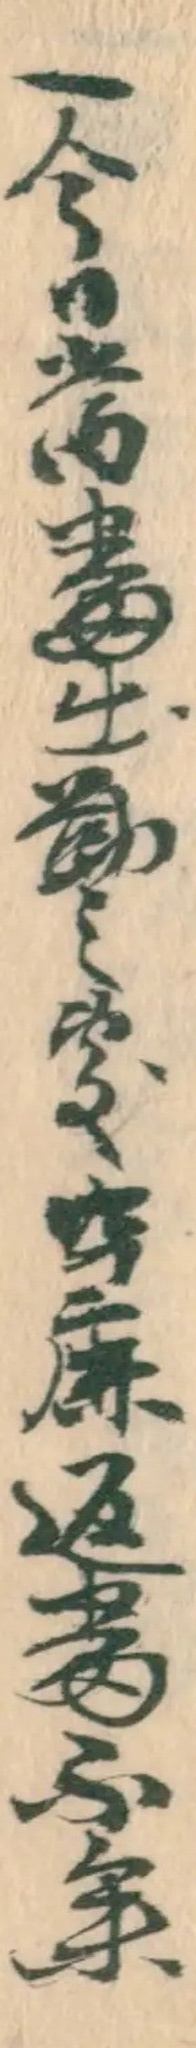一今日当番出勤之処虫鹿返番不参
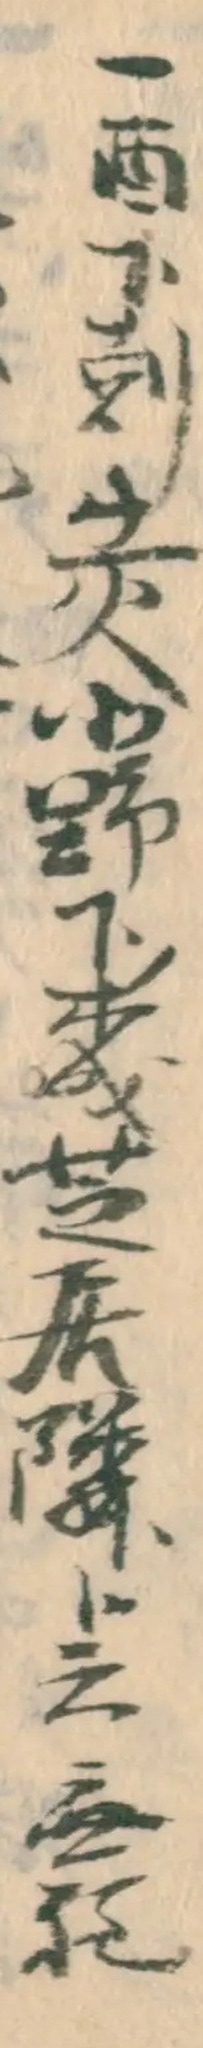一酉下刻出火北野下ノ森芝居隣ト云無程
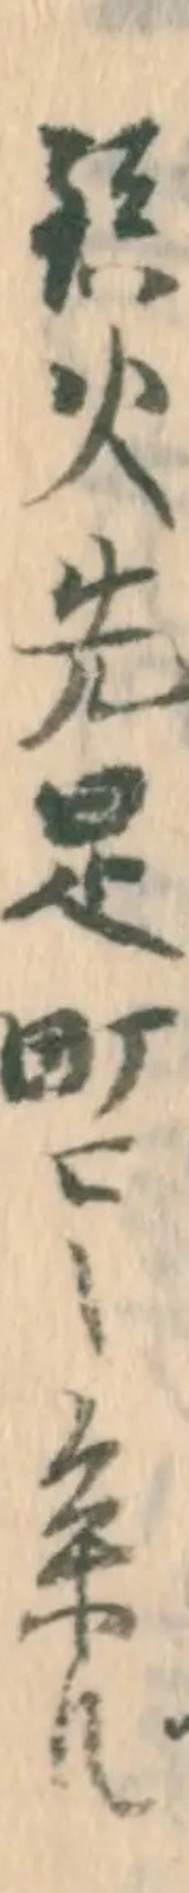鎮火先是町口へ参ル
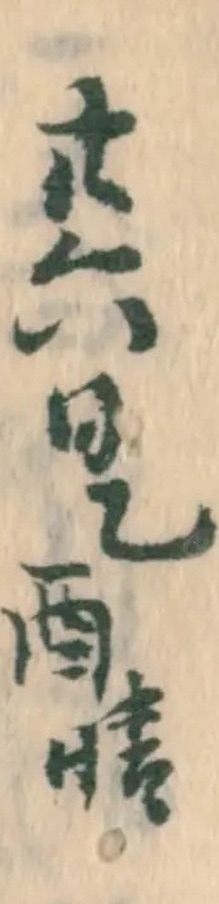廿六日乙酉晴
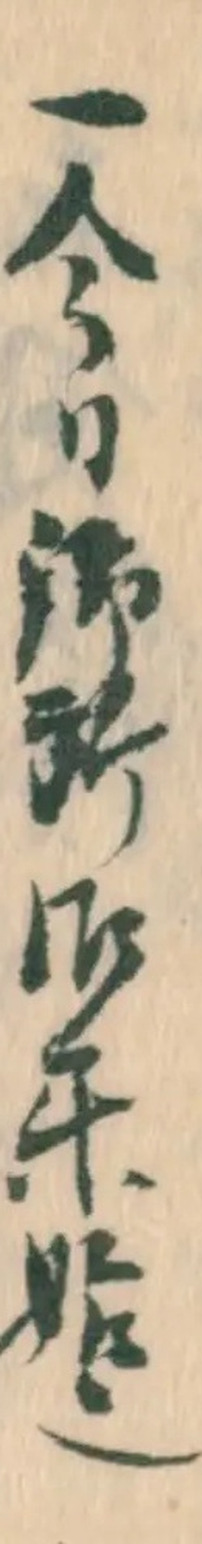一今日御所御楽始也
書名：禁裏御所御用日記. [131]
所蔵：国立国会図書館 National Diet Library, JAPAN
